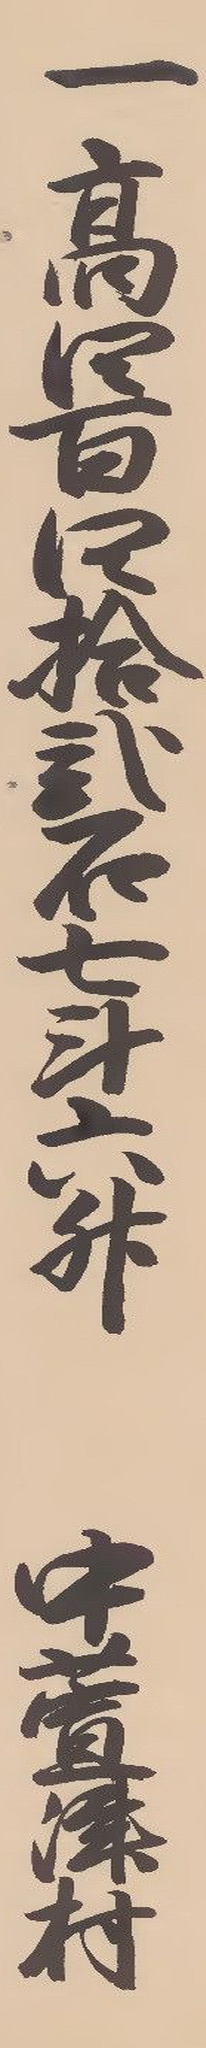一高四百四拾弐石七斗六升中萱津村
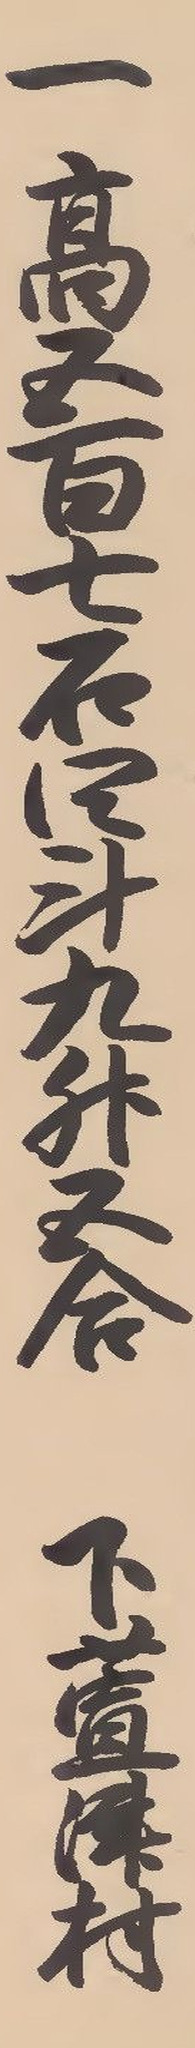一高五百七石四斗九升五合下萱津村
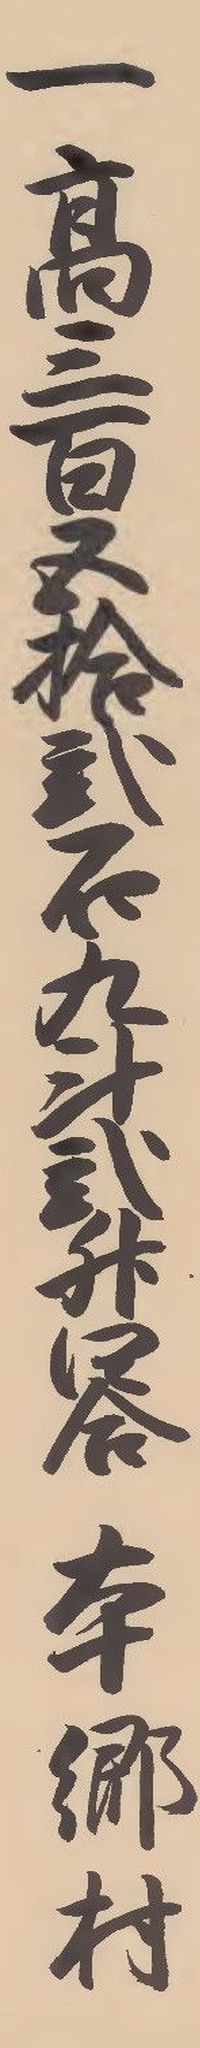一高三百五拾弐石九斗弐升四合本郷村
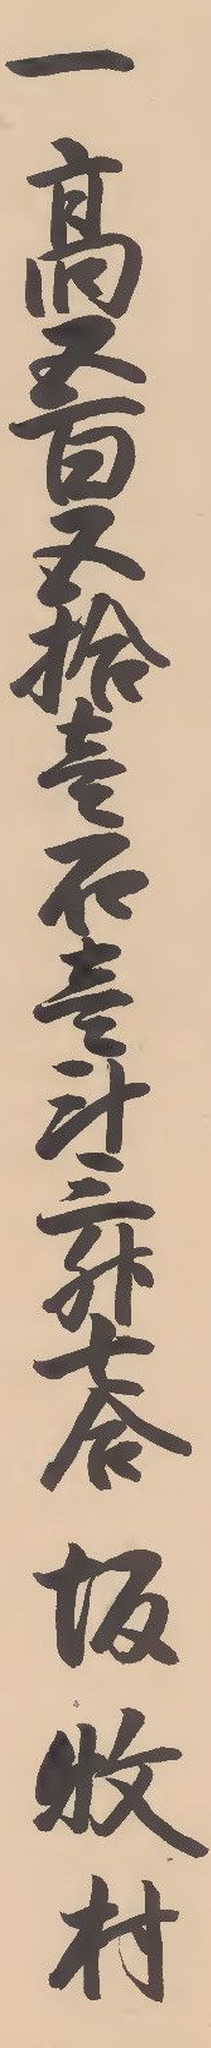一高五百五拾壱石壱斗三升七合坂牧村
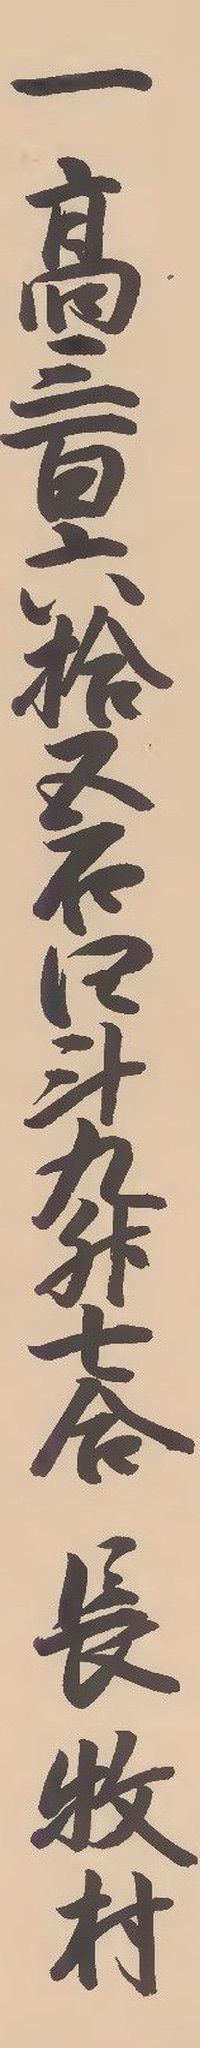一高三百六拾五石四斗九升七合長牧村

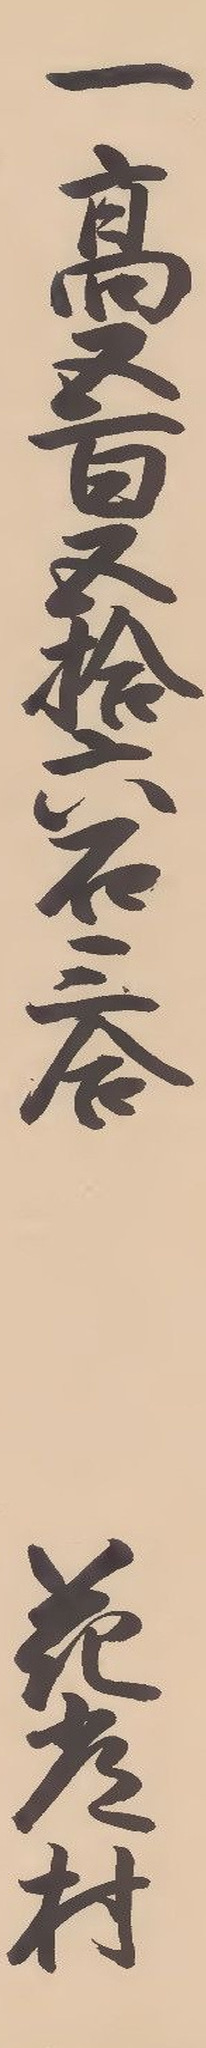一高五百五拾六石三合花常村
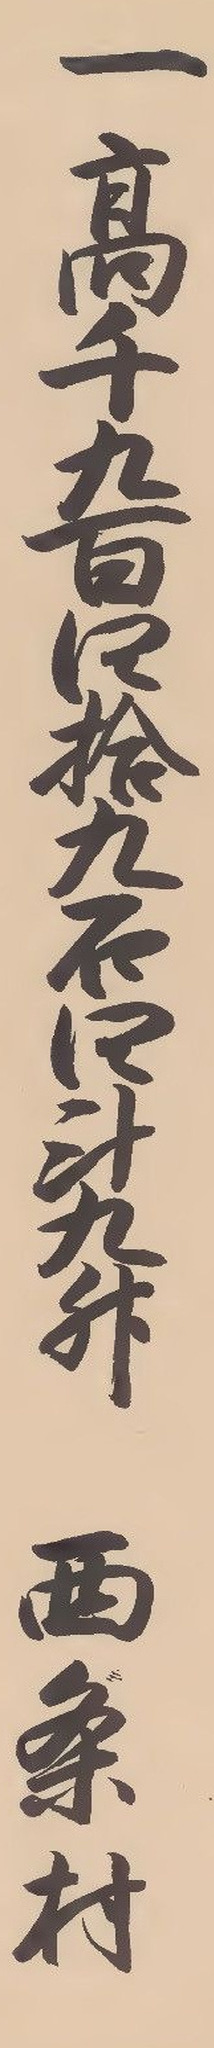一高千九百四拾九石四斗九升西条村
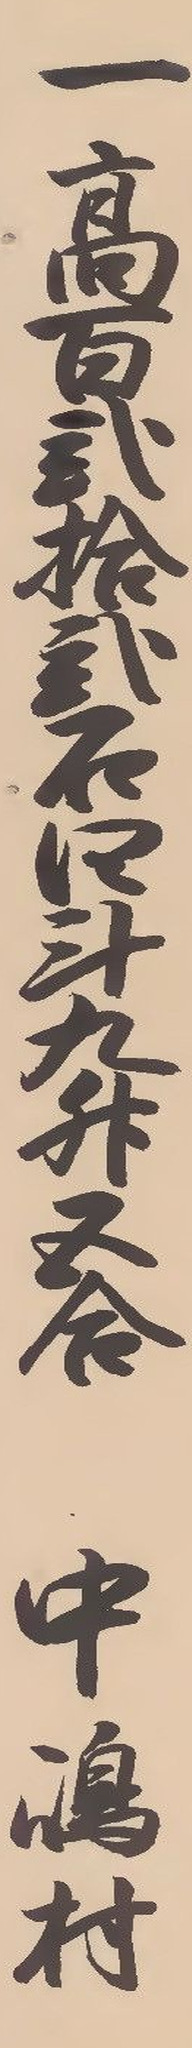一高百弐拾弐石四斗九升五合中島村
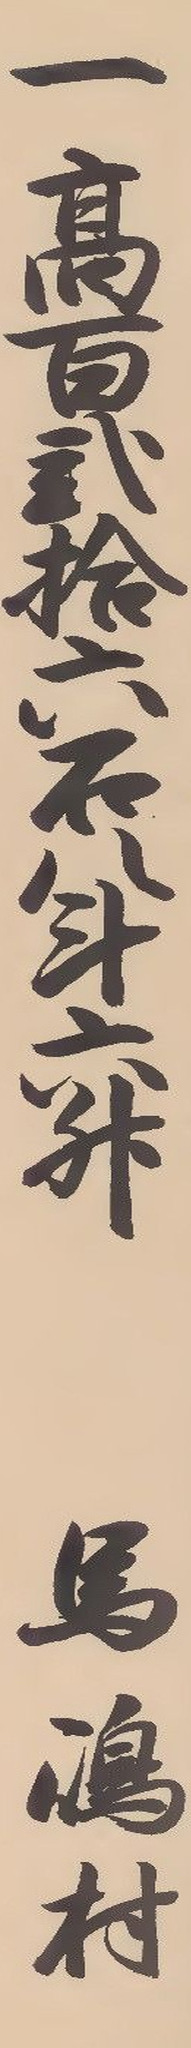一高百弐拾六石八斗六升馬島村
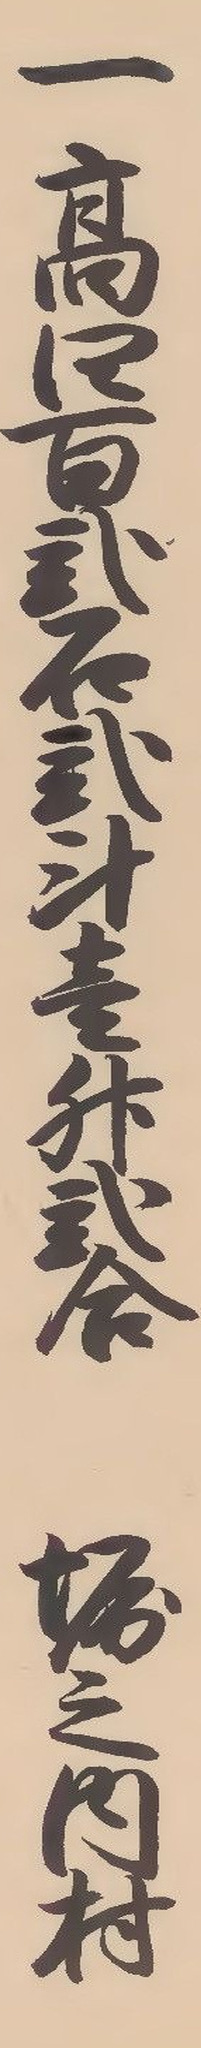一高四百弐石弐斗壱升弐合堀之内村
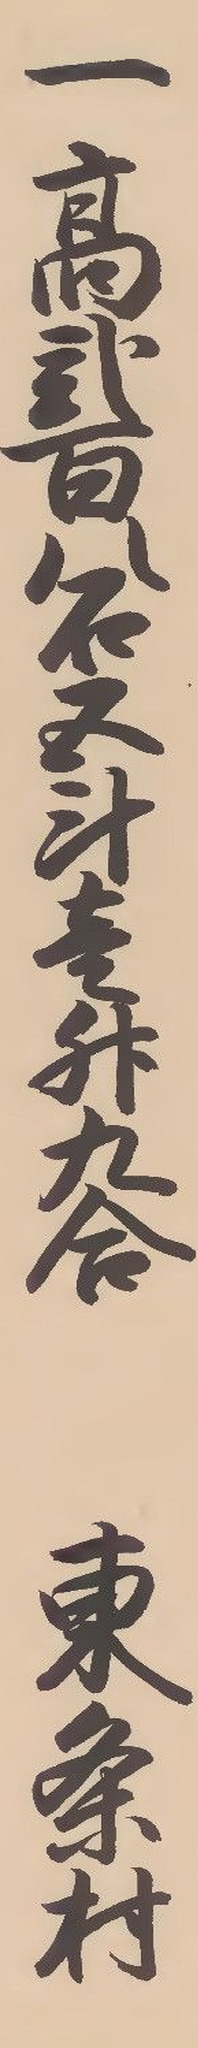一高弐百八石五斗壱升九合東条村
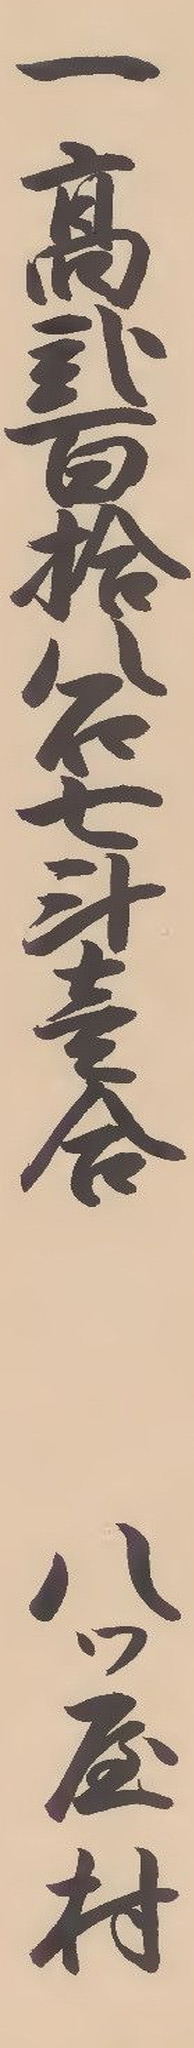一高弐百拾八石七斗壱合八ツ屋村

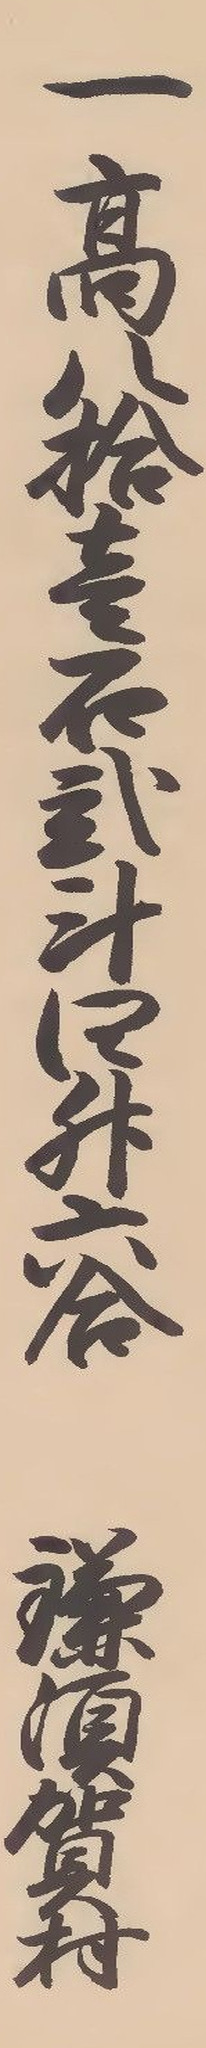一高八拾壱石弐斗四升六合鎌須賀村
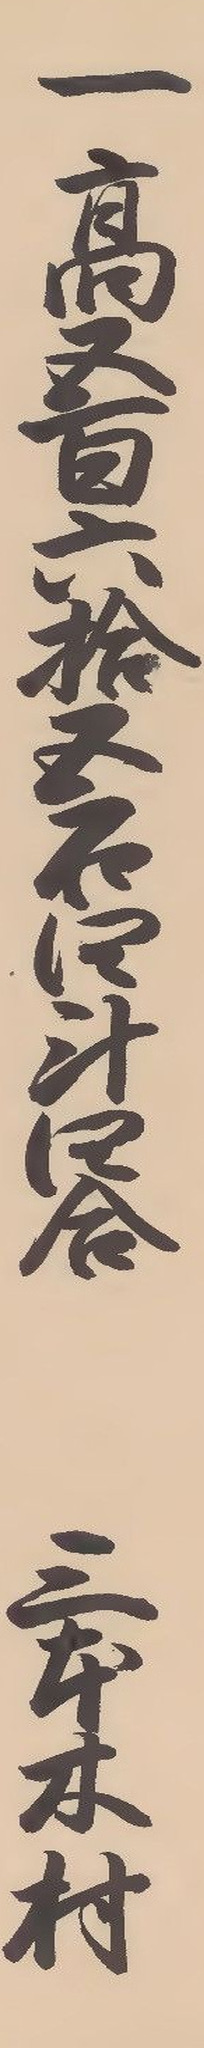一高五百六拾五石四斗四合三本木村
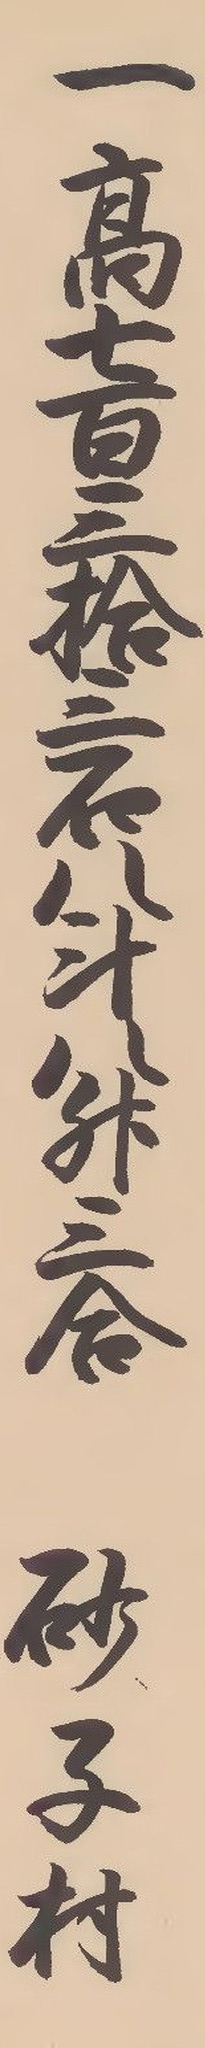一高七百三拾三石八斗八升三合砂子村
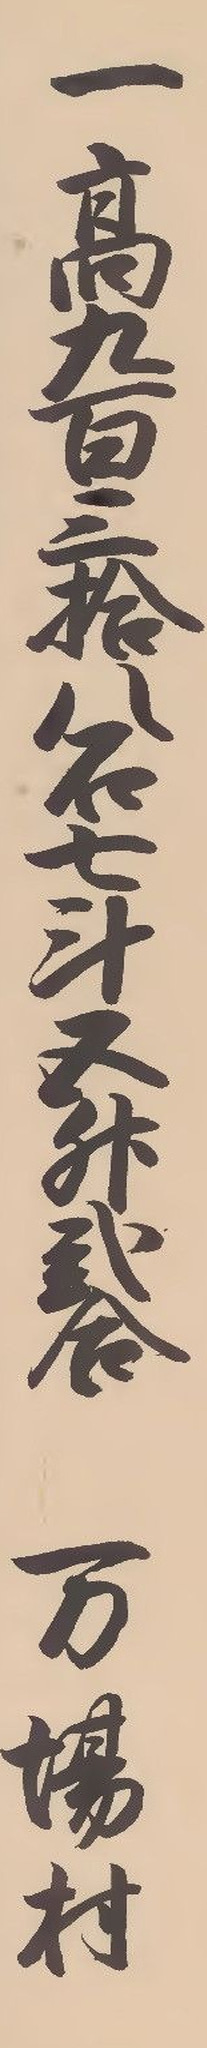一高九百三拾八石七斗五升弐合万場村
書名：尾張国郷帳
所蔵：国立公文書館 National Archives of Japan
